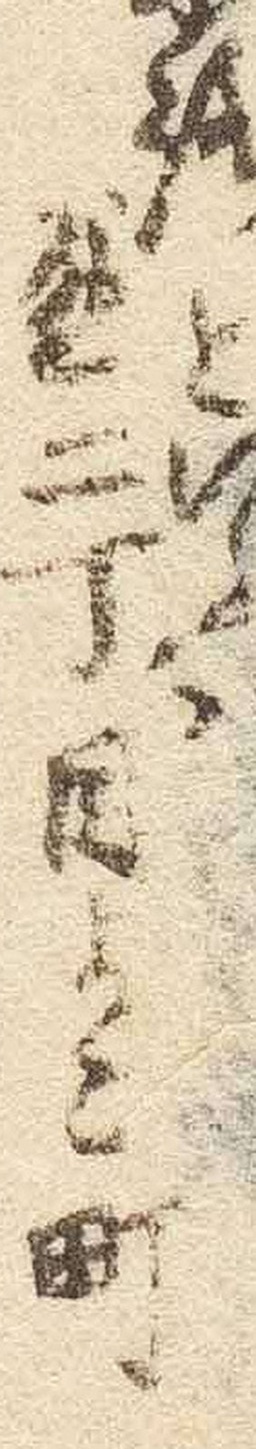通二丁目よこ町
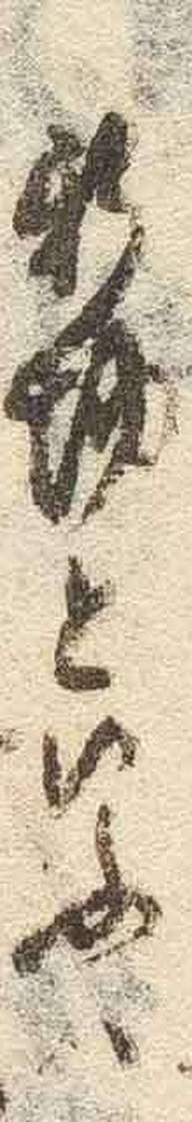新場といふは
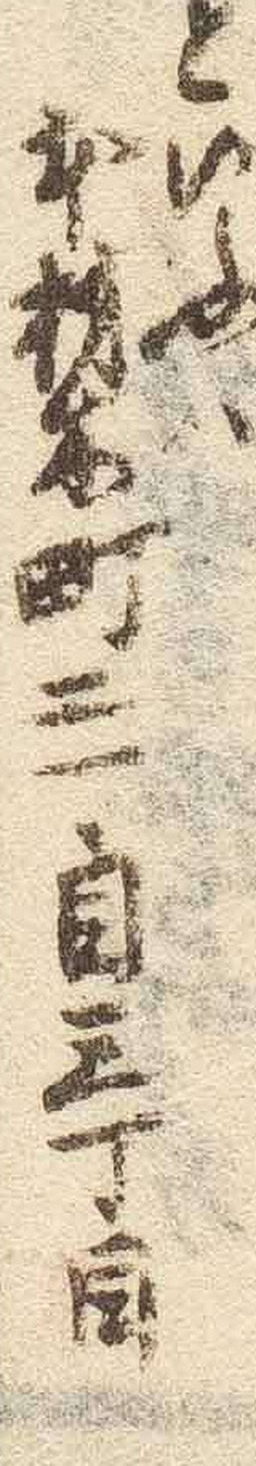本材木町二丁目三丁目
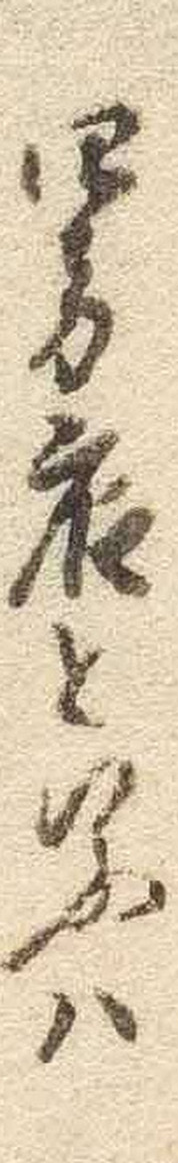四方店といふは
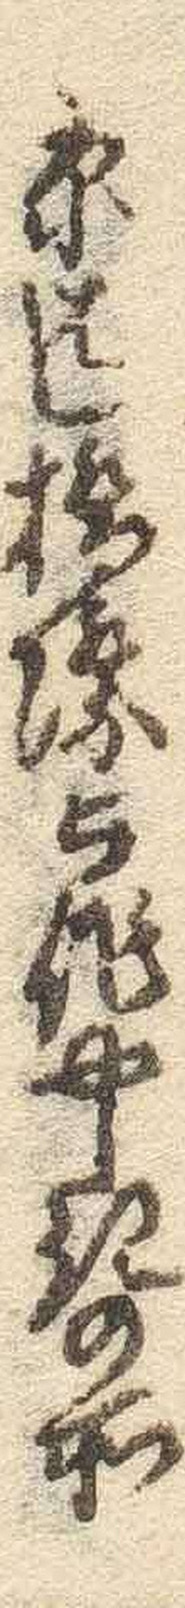京はし橋際与作やしきの所
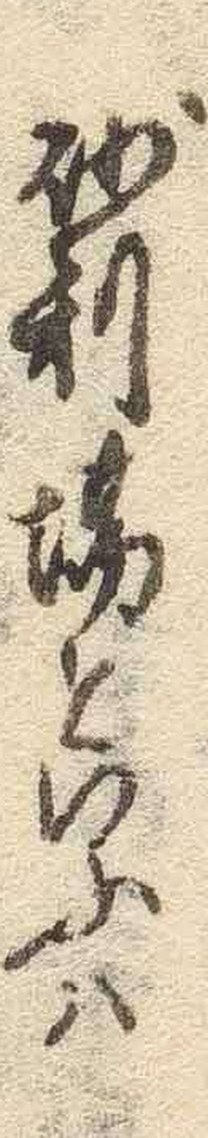砂利場といふは
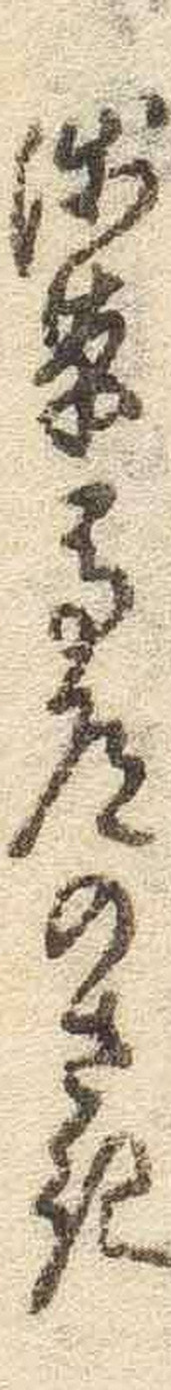浅草馬道のさき
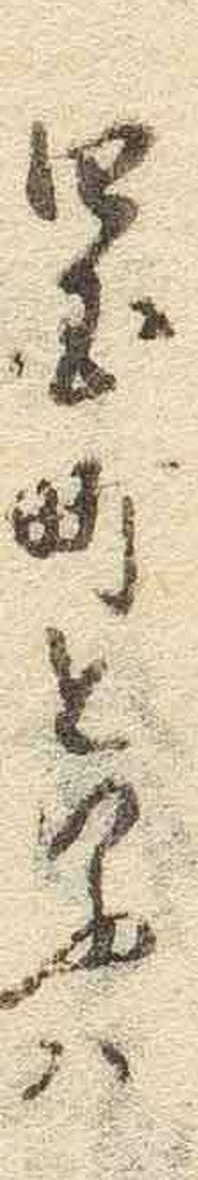四国町といふは
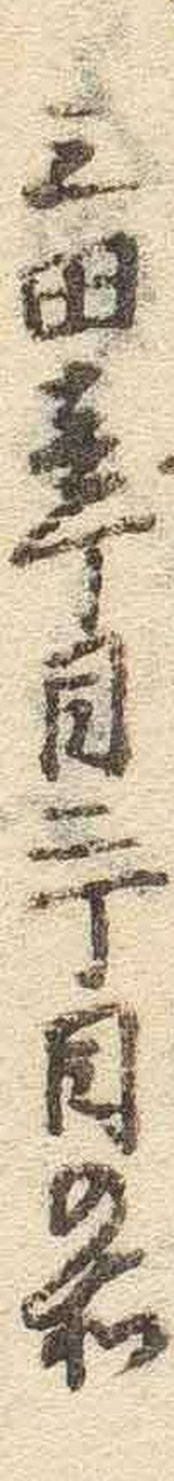三田壱丁目二丁目の所
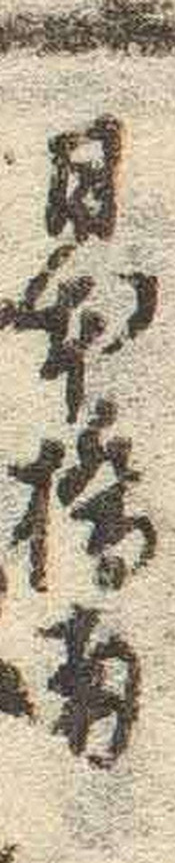日本橋南
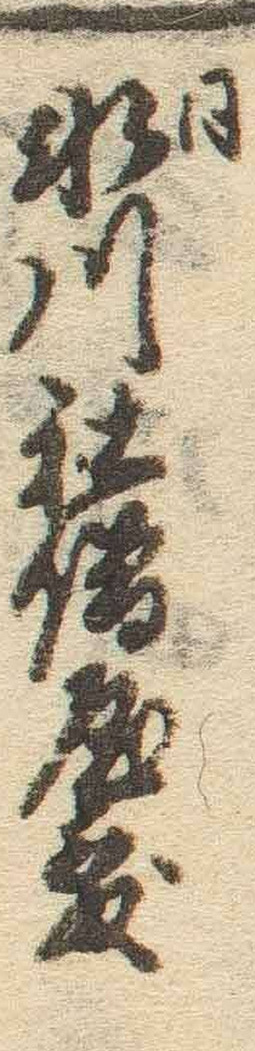氷川社僧屋敷
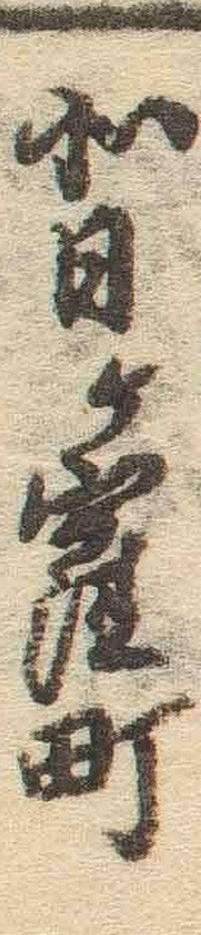北日ヶ窪町
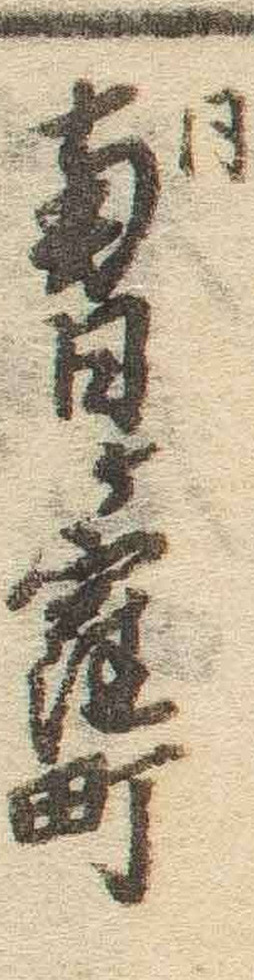南日ヶ窪町

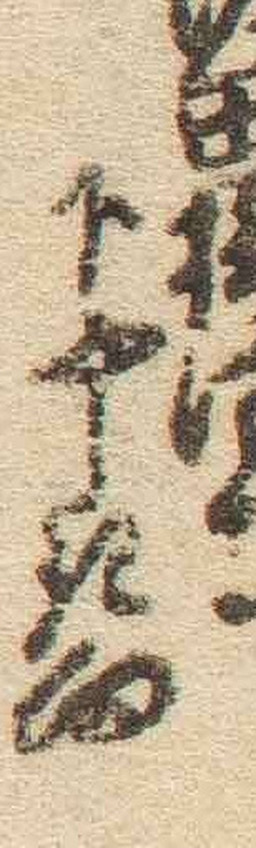下やしき向
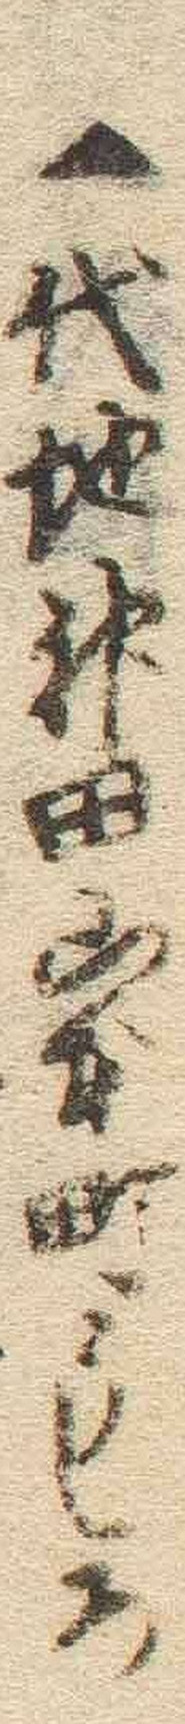▲代地神田山本町うしろ
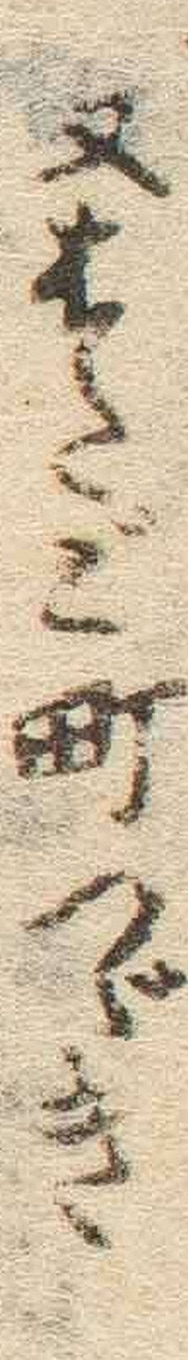又はたご町つゞき
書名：江戸町独案内
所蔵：東京学芸大学附属図書館 国文学研究資料館
